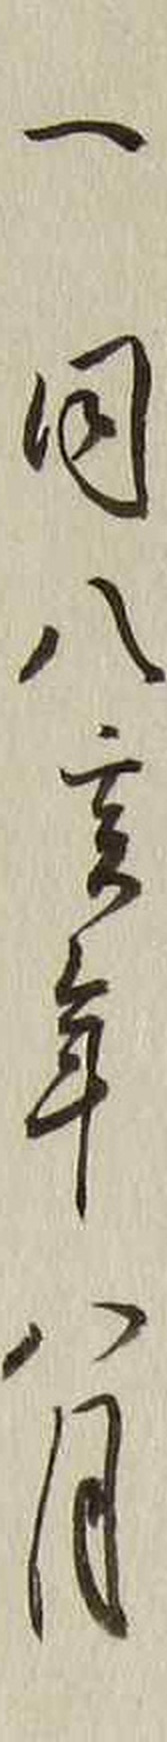一同八亥年八月
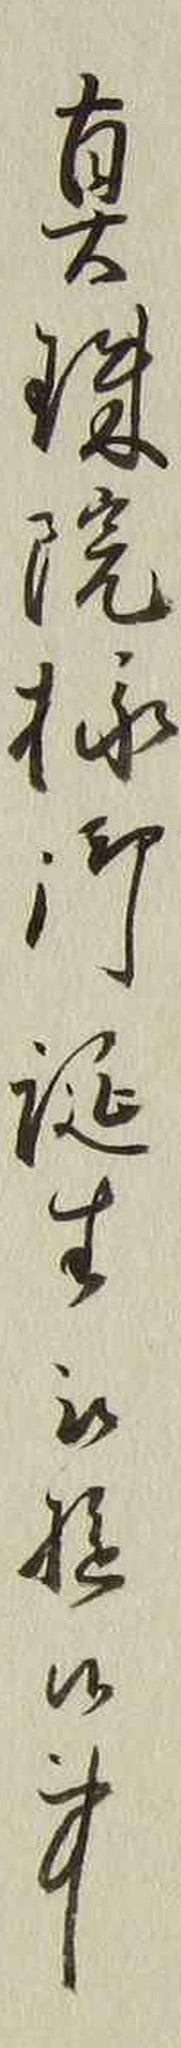真珠院様御誕生被遊候事
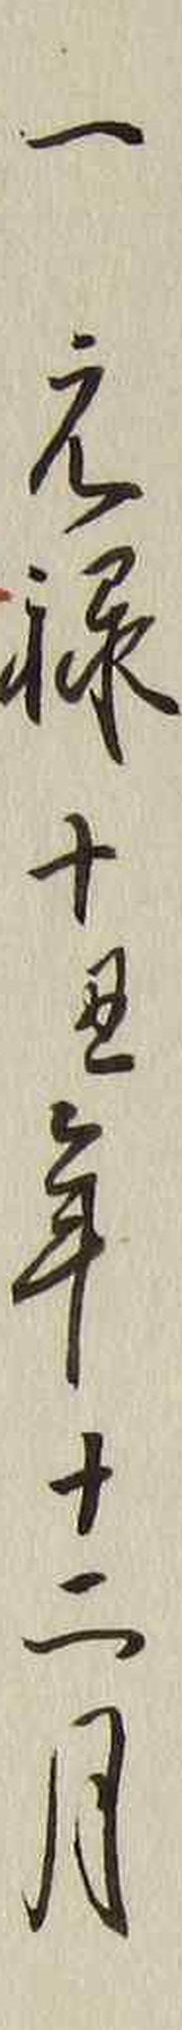一元禄十丑年十二月
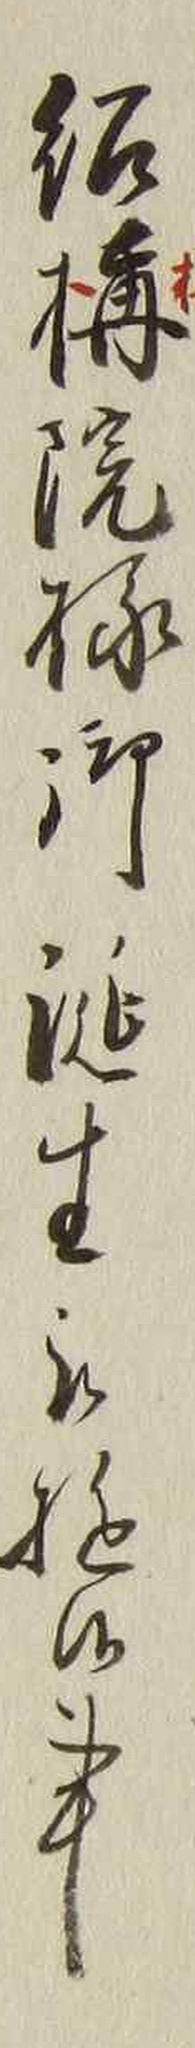真珠院様御誕生被遊候事
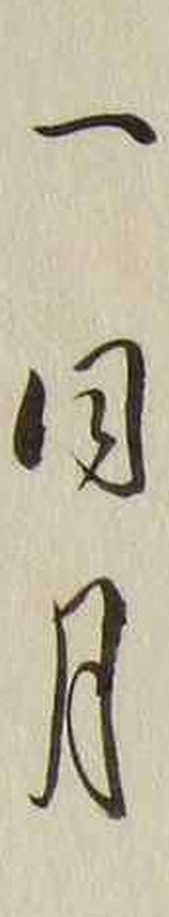一同月

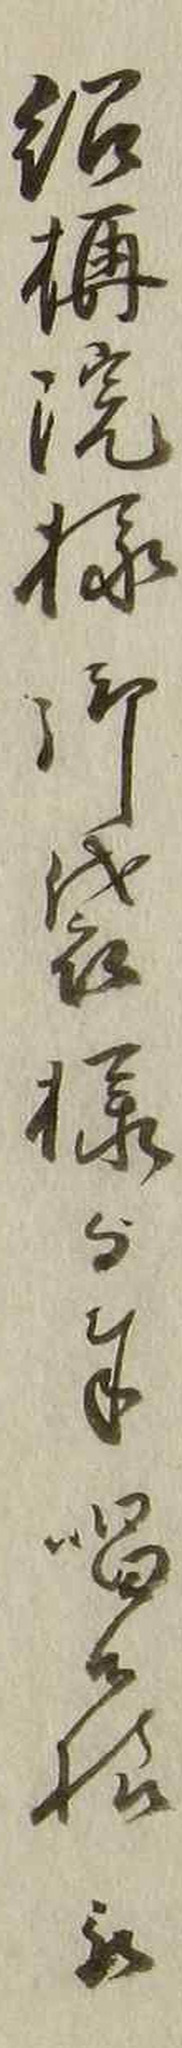紹栴院様御袋様与奉唱候様被
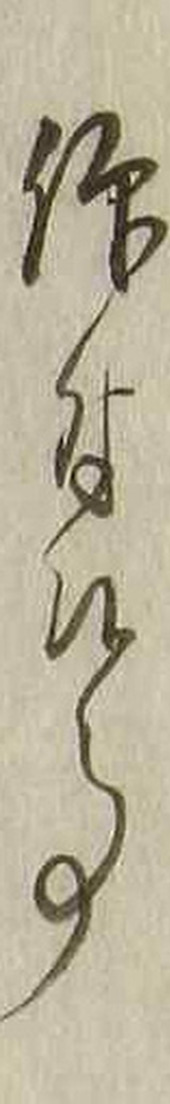仰付候事
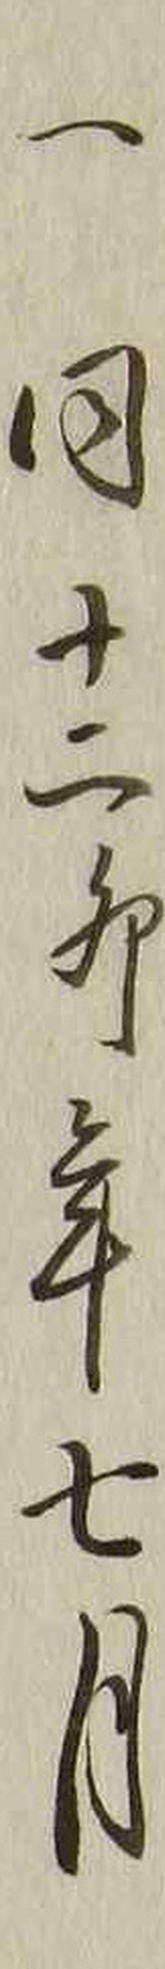一同十二卯年七月
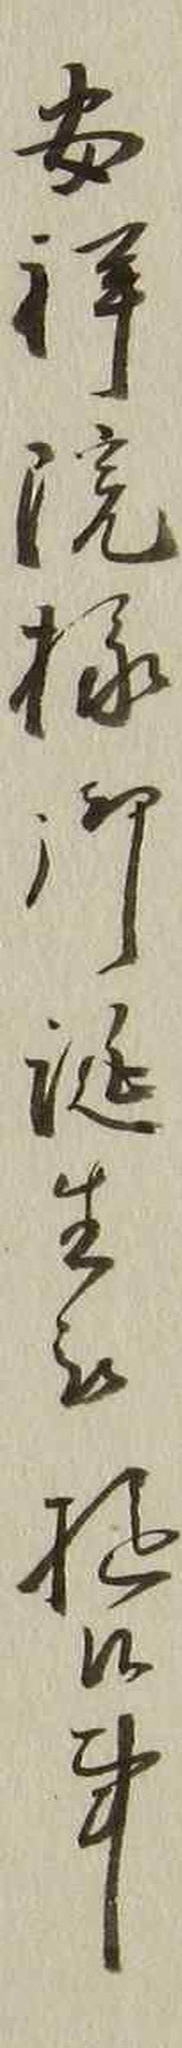安祥院様御誕生被遊候事
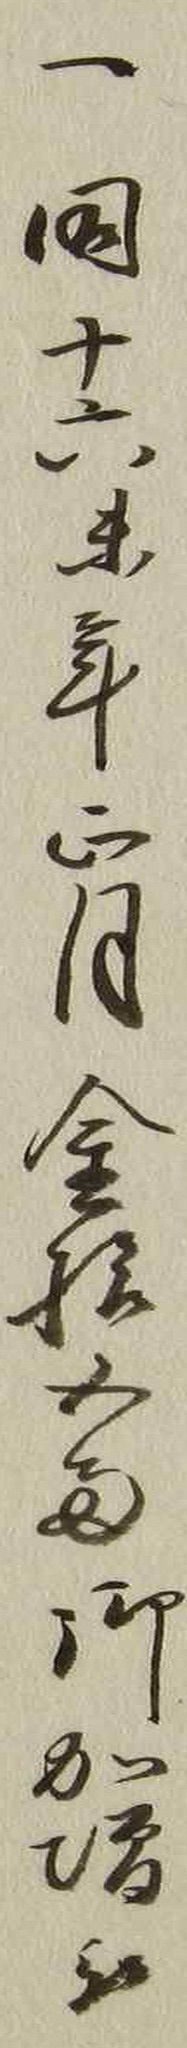一同十六未年正月金拾五両御加増被
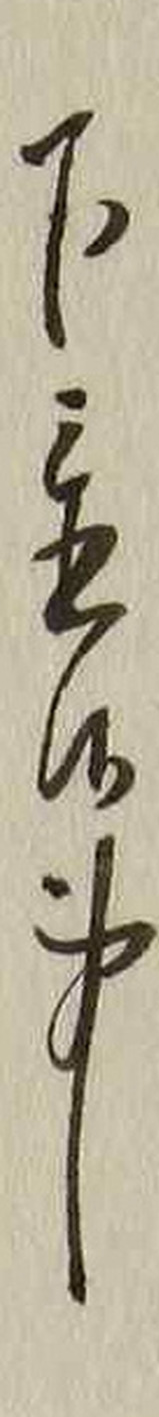下置候事
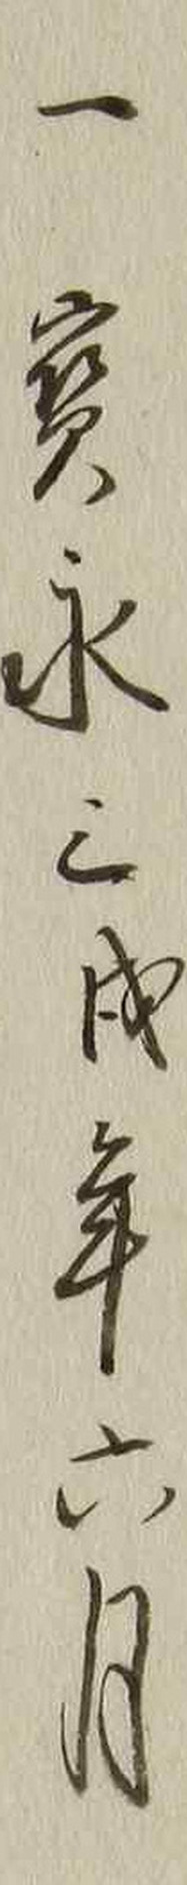一宝永三戌年六月
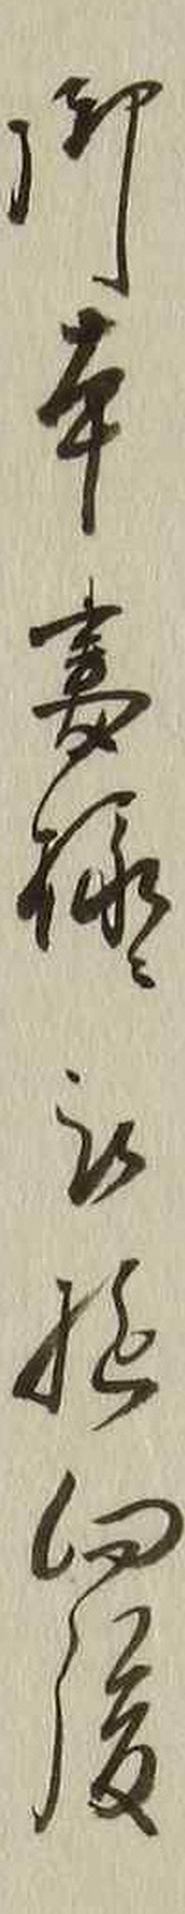御本妻様ニ被遊向後
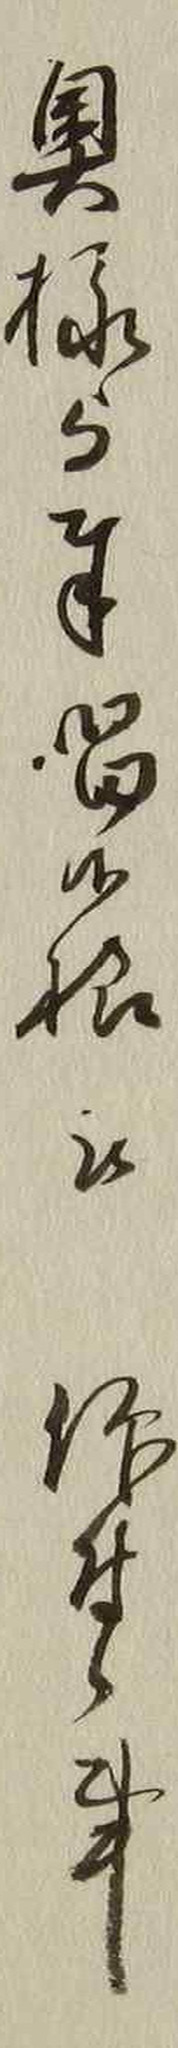奥様与奉唱候様被仰付候事
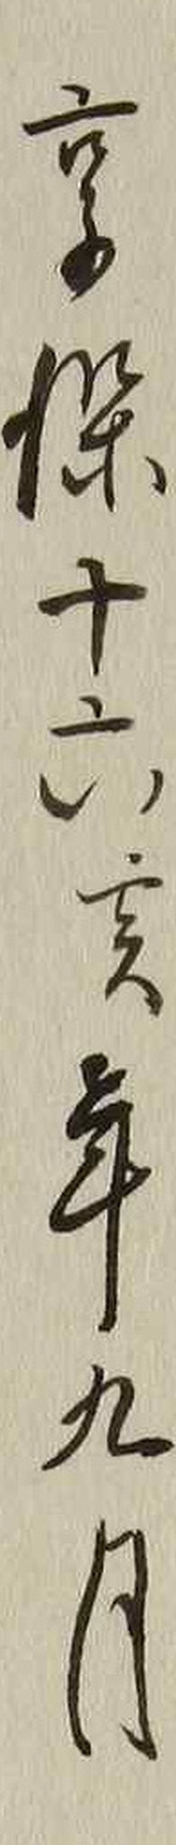享保十六亥年九月
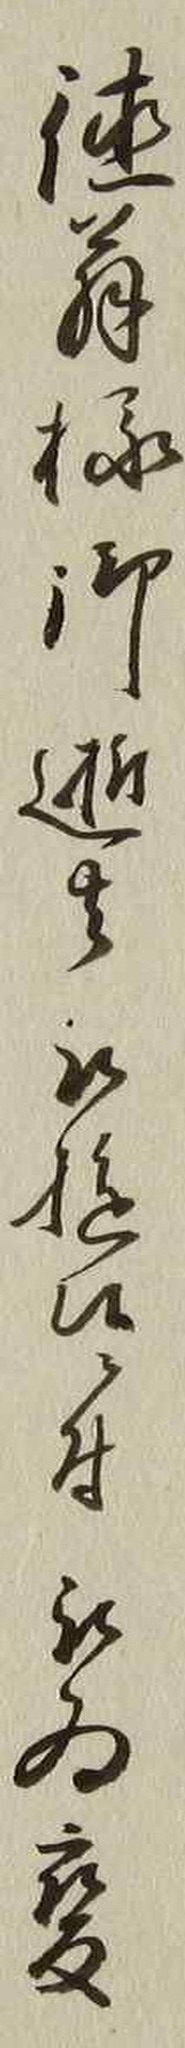徳翁様御逝去被遊候ニ付被為変
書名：諸士系譜　巻之122　よ之部5
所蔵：会津若松市立会津図書館
